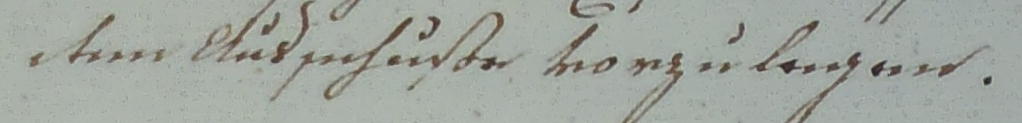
dem Ausschusse vorzulegen.
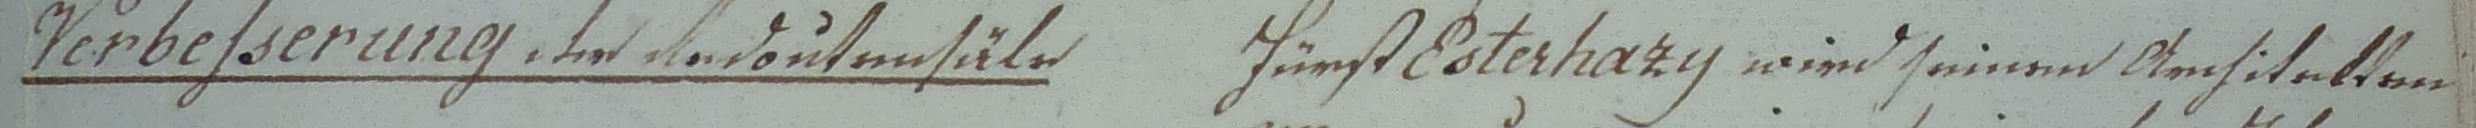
Verbesserung der Redoutensäle Fürst Esterhazy wird seinen Architekten
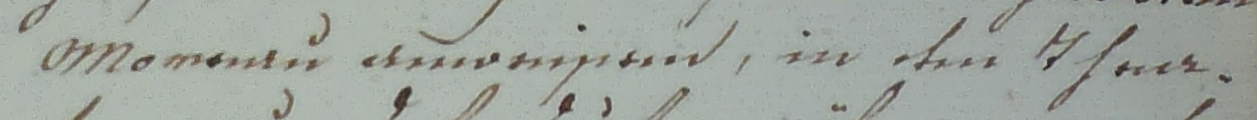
Morenau anweisen, in den Thea¬
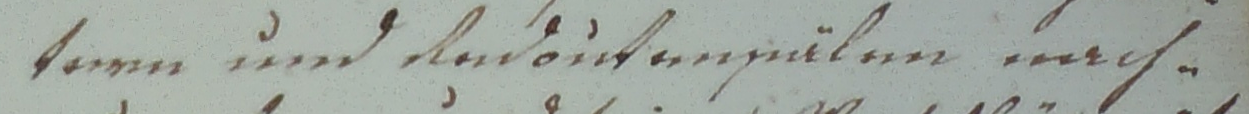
tern und Redoutensälen nach¬
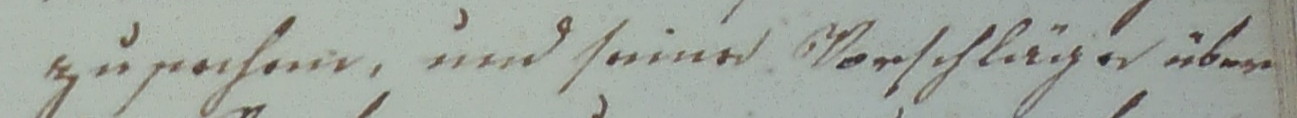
zusehen, und seine Vorschläge über
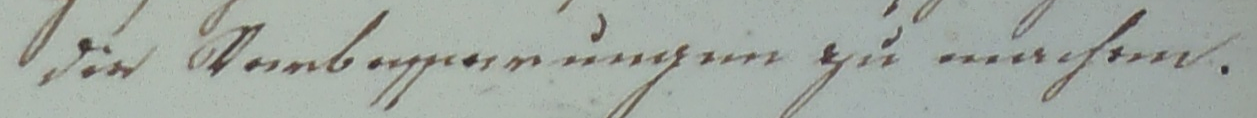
die Verbesserungen zu machen.
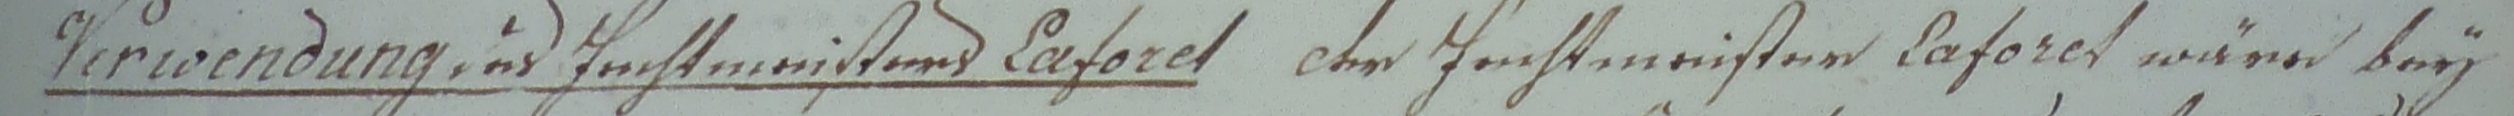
Verwendung des Fechtmeisters Caforet Der Fechtmeister Caforet wäre bey
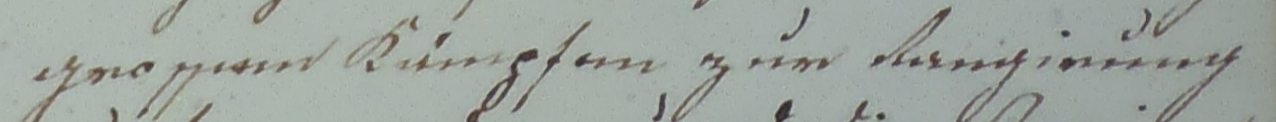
grossen Kämpfen zur Rangirung
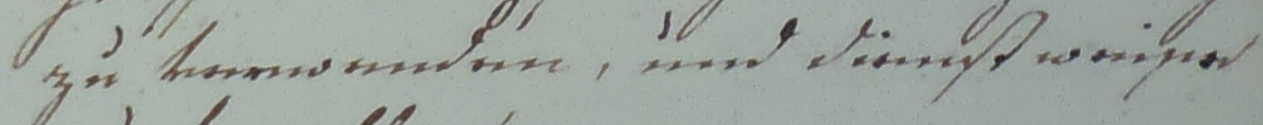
zu verwenden, und dienst weise
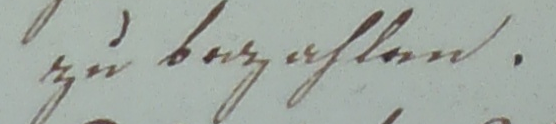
zu bezahlen.
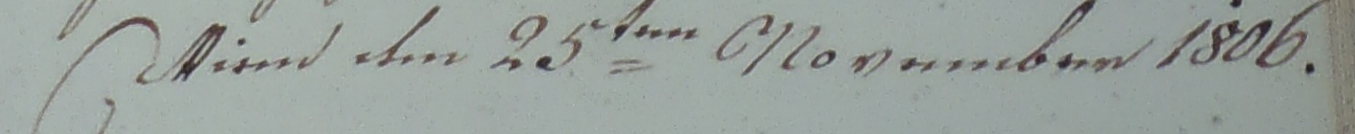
Wien den 25t͇en November 1806.
